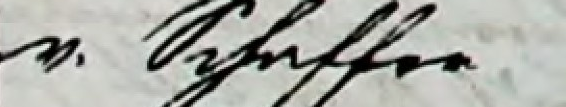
v. Schuffer
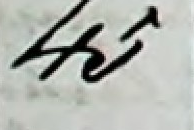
45
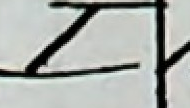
I
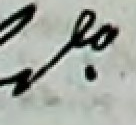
Do
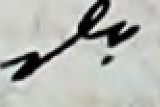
Do
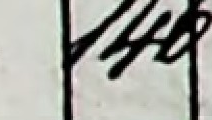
146
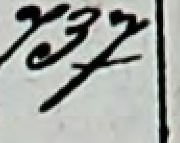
737
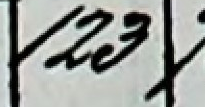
123
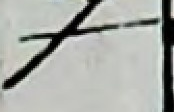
7
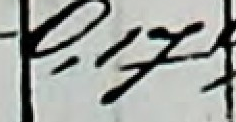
0,17
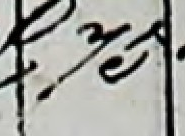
0,75
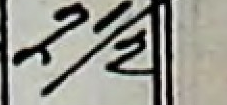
2 1/2
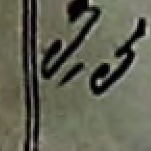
3,5
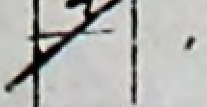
7
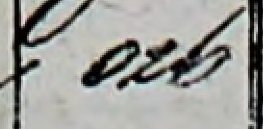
0,026
